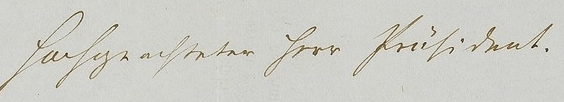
Hochgeachteter Herr Präsident.
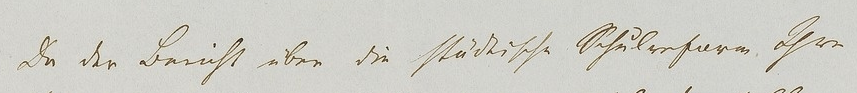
Da der Bericht über die städtische Schulreform Ihre
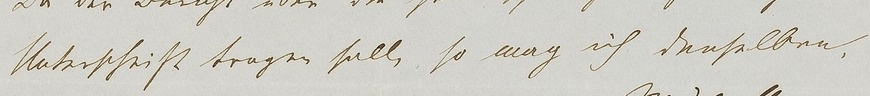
Unterschrift tragen soll, so mag ich denselben,
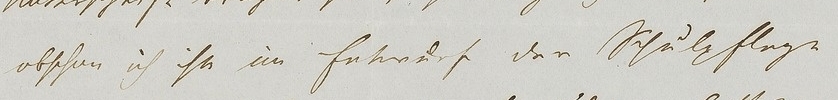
obschon ich ihn im Entwurf der Schulpflege
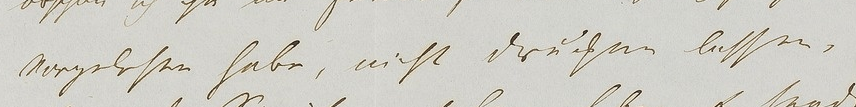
vorgelesen habe, nicht drucken lassen,
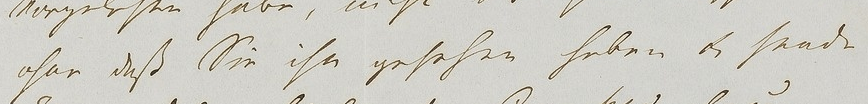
ohne daß Sie ihn gesehen haben & sende
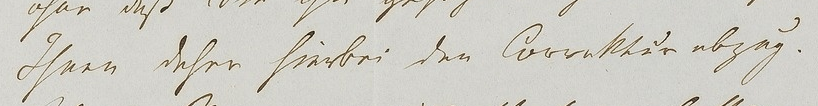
Ihnen daher hierbei den Correkturabzug.
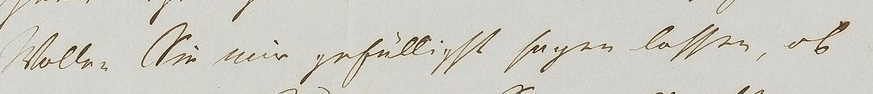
Wollen Sie mir gefälligst sagen lassen, ob
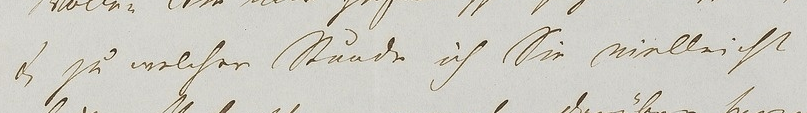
& zu welcher Stunde ich Sie vielleicht
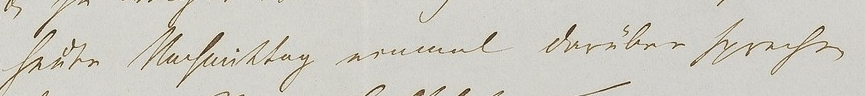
heute Nachmittag einmal darüber sprechen
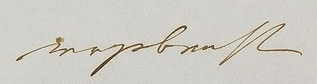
ergebenst
